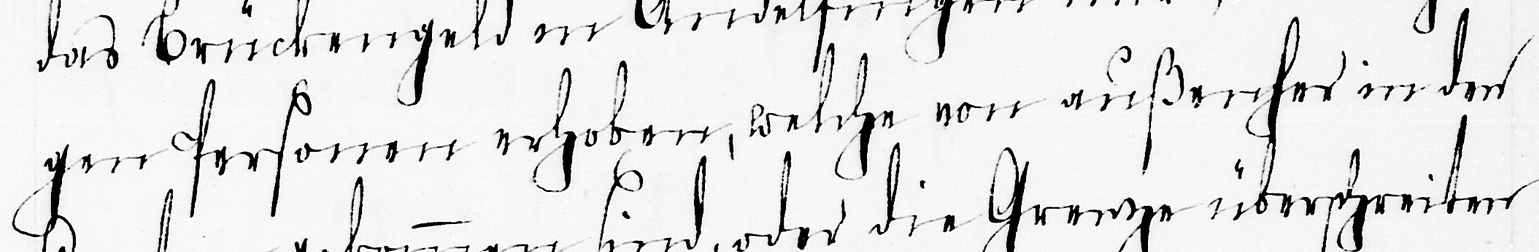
gen Personen erhoben, welche von außenher in den
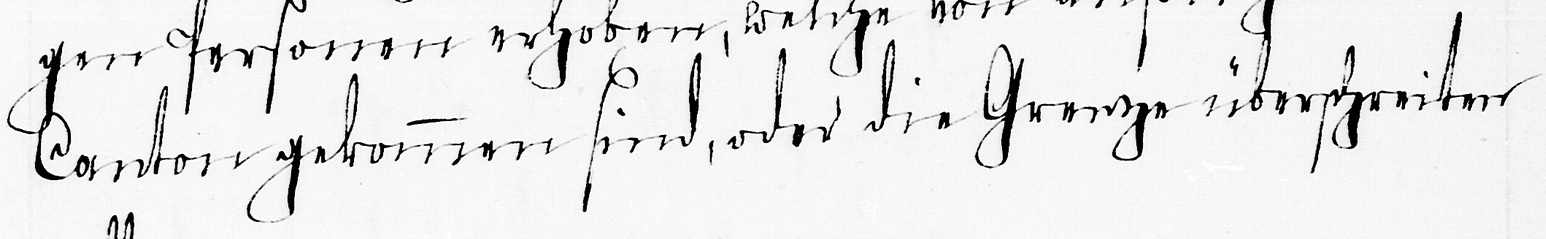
Canton gekommen sind, oder die Grenze überschreiten
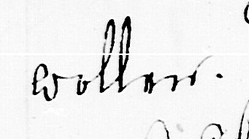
wollen.
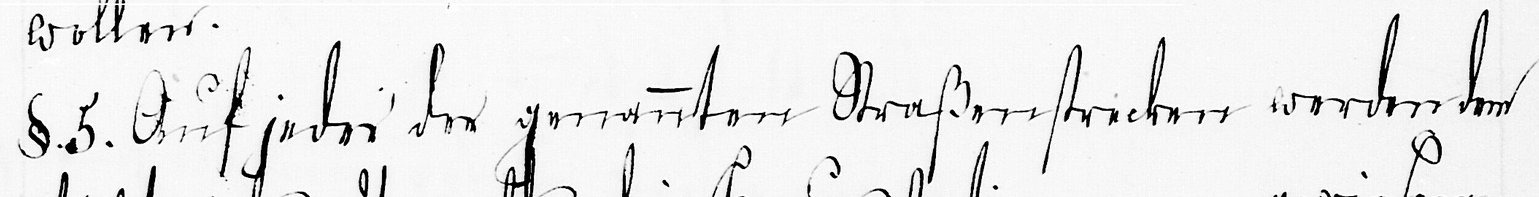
§. 5. Auf jeder der genannten Straßenstrecken werden dem
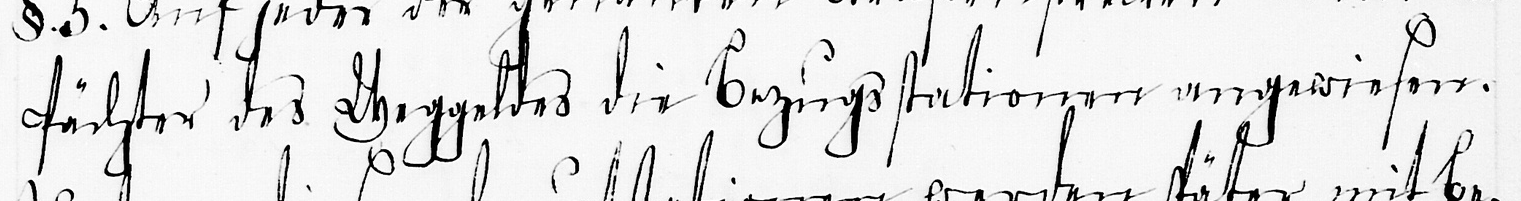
Pächter des Weggeldes die Bezugsstationen angewiesen.
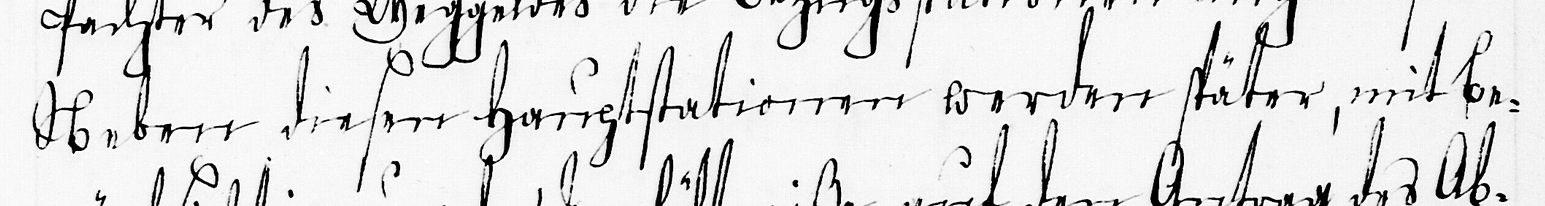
Neben diesen Hauptstationen werden später, mit Be¬
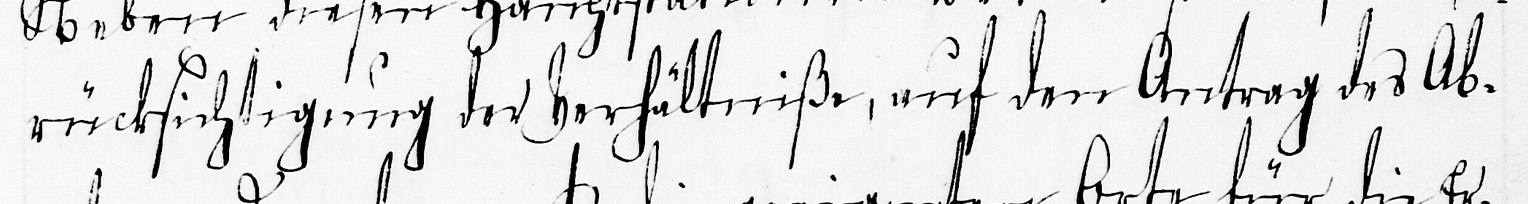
rücksichtigung der Verhältniße, auf den Antrag des Ab¬
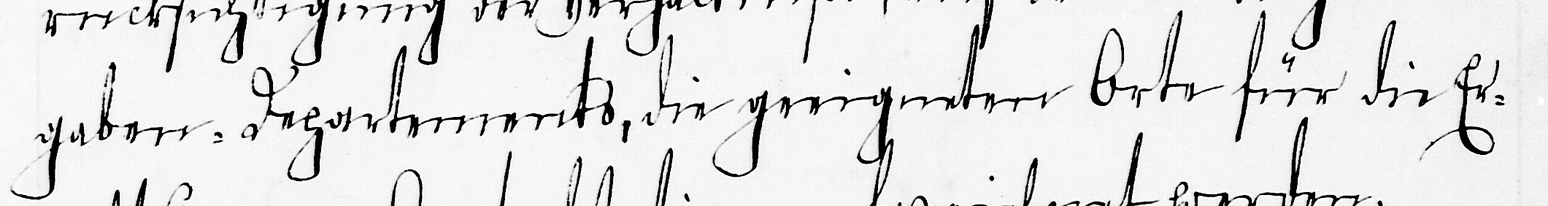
gaben-Departements, die geeigneten Orte für die Er¬
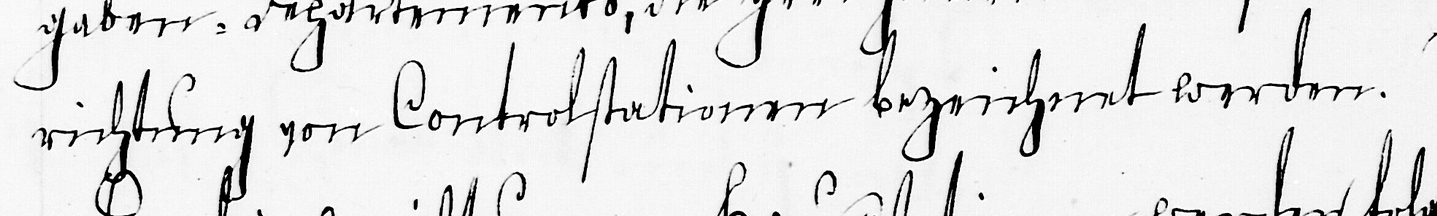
richtung von Controlstationen bezeichnet werden.
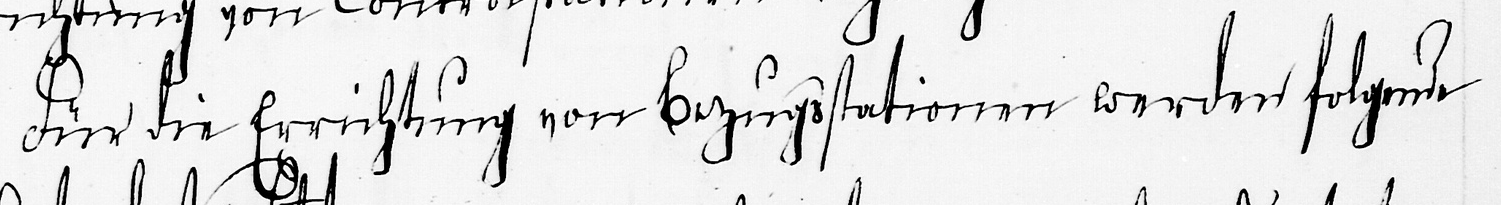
Für die Errichtung von Bezugsstationen werden folgende
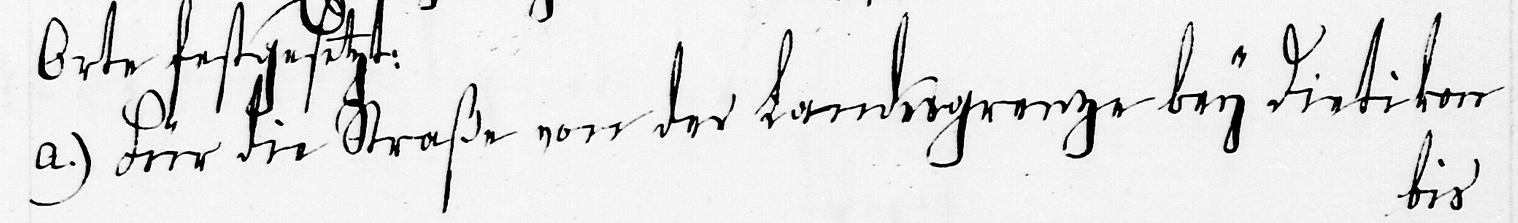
a.) Für die Straße von der Landesgrenze bey Dietikon
